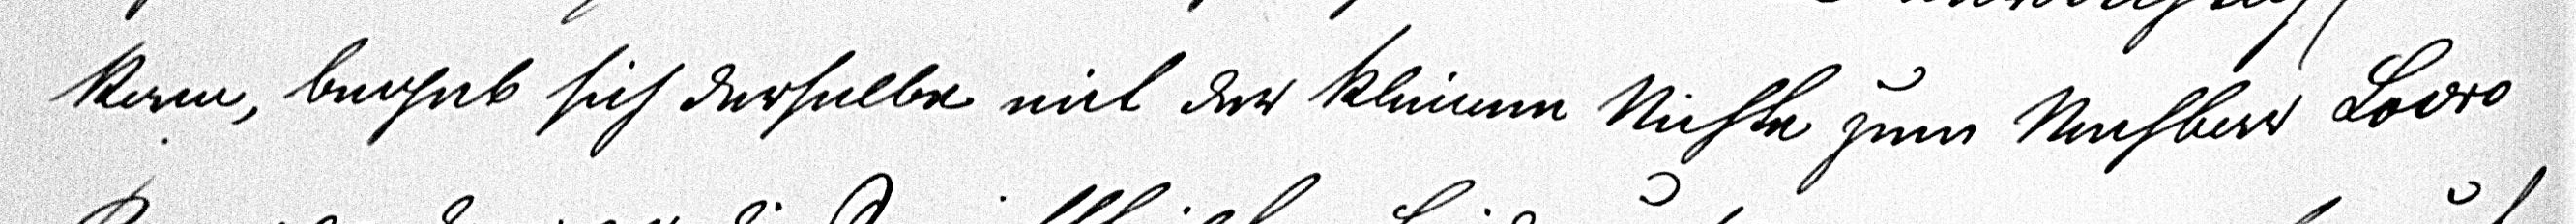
kam, begab sich derselbe mit der kleinen Nichte zum Nachbar Loxx
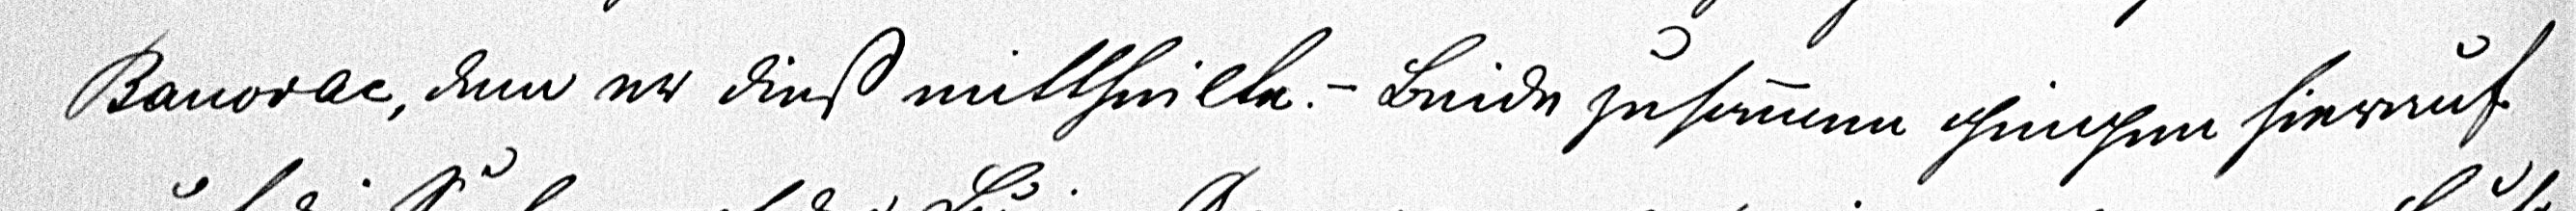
Banovac, dem er dieß mittheilte.- Beide zusammen gingen hierauf
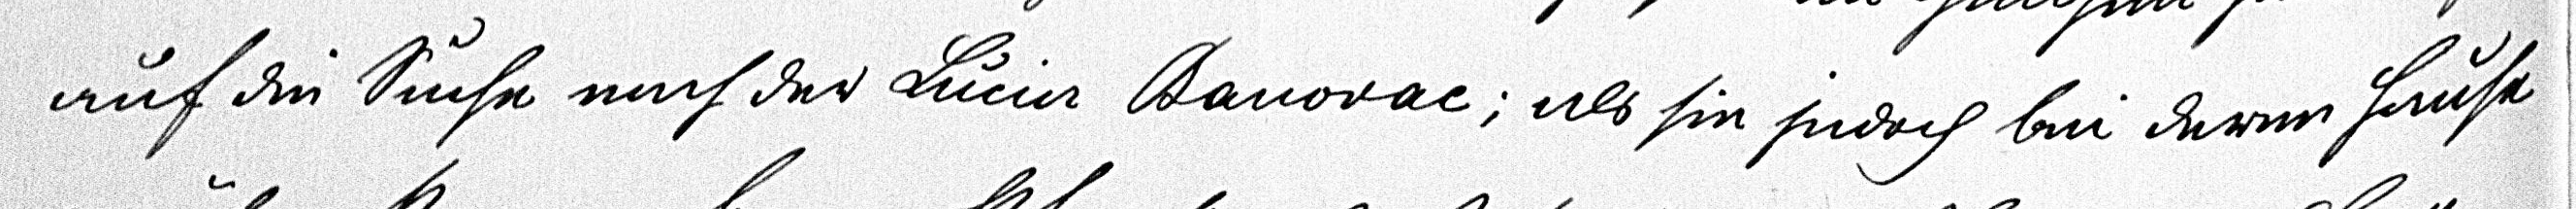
auf die Suche nach der Lucia Banovac; als sie jedoch bei deren Hause
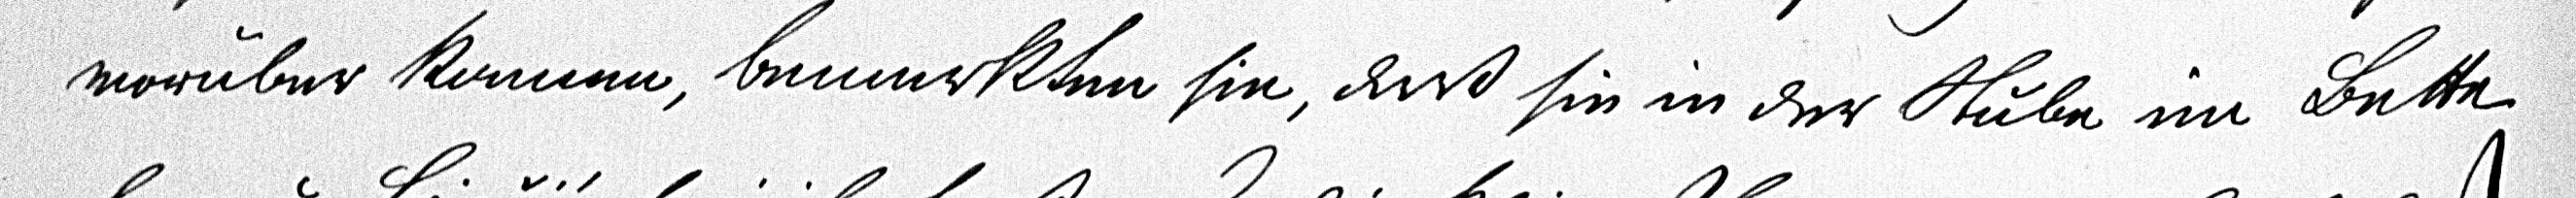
woruber komme, bemerkten sie, daß sie in der xxube im Bette
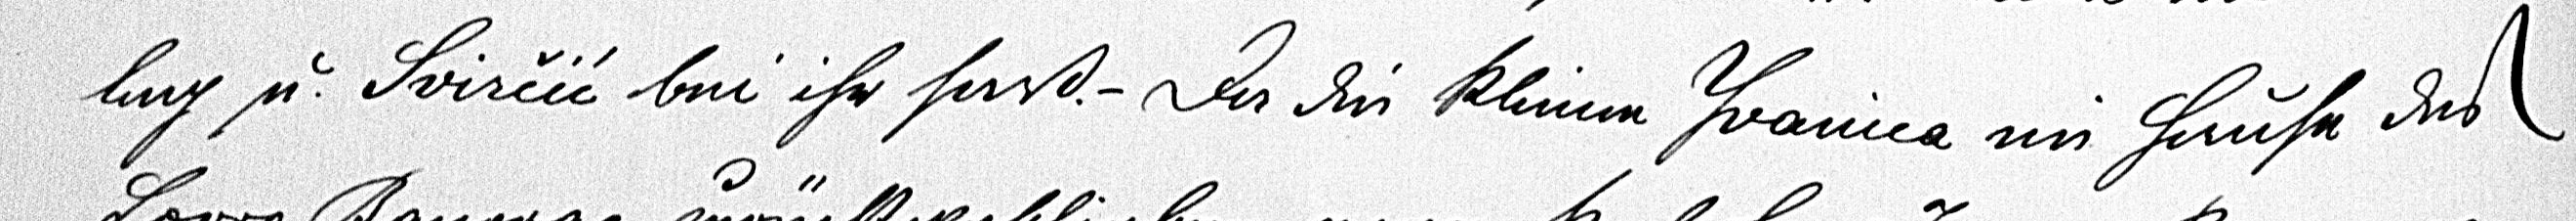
leg u. Svirčić bei ihr saß.- Da die kleine Yvanica im Hause des
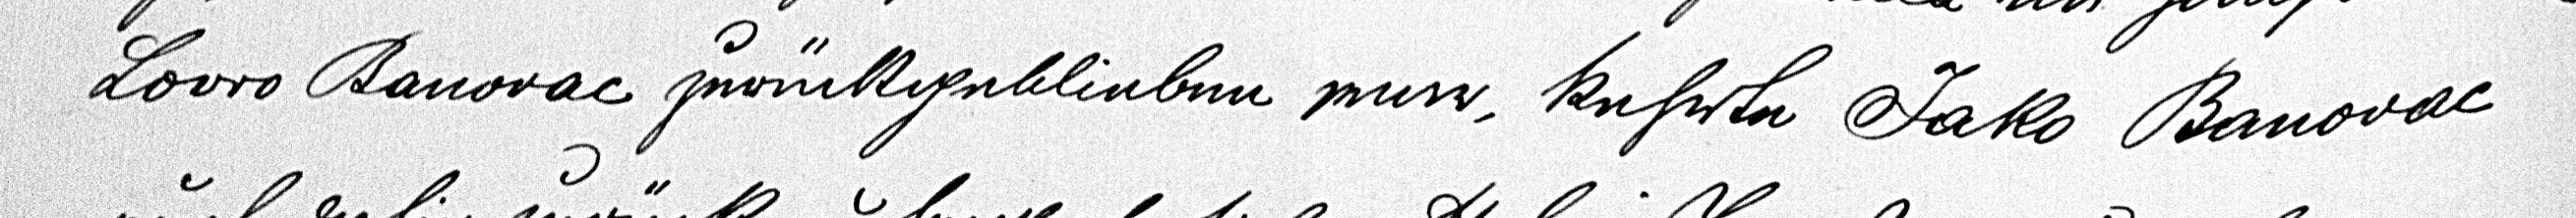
Loxx Banovac zurückgeblieben war, kehrte Jako Banovac
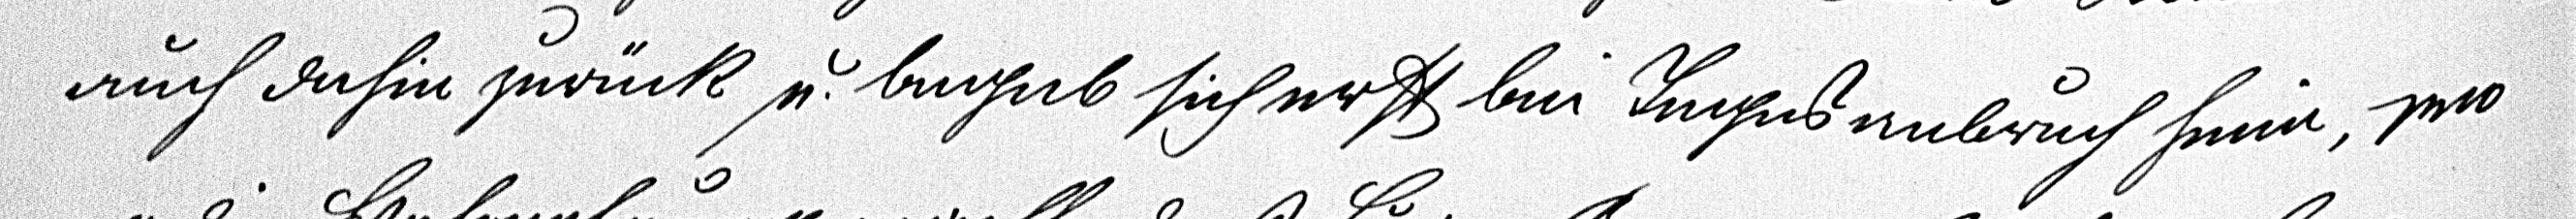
auch dahin zurück u. begab sich erst bei Tagesanbruchheim, wo
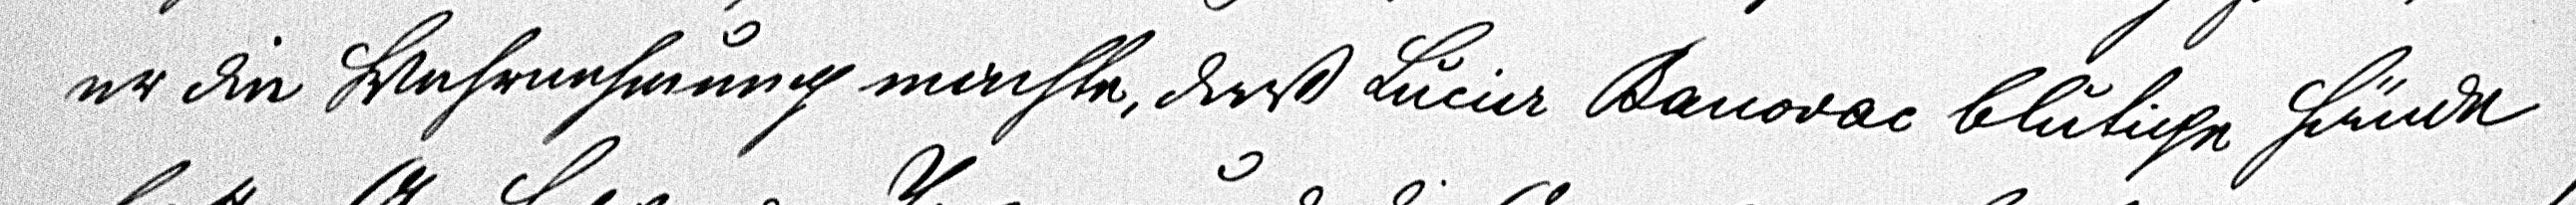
er die Wahrnehmung machte, daß Lucia Banovac blutige Hände
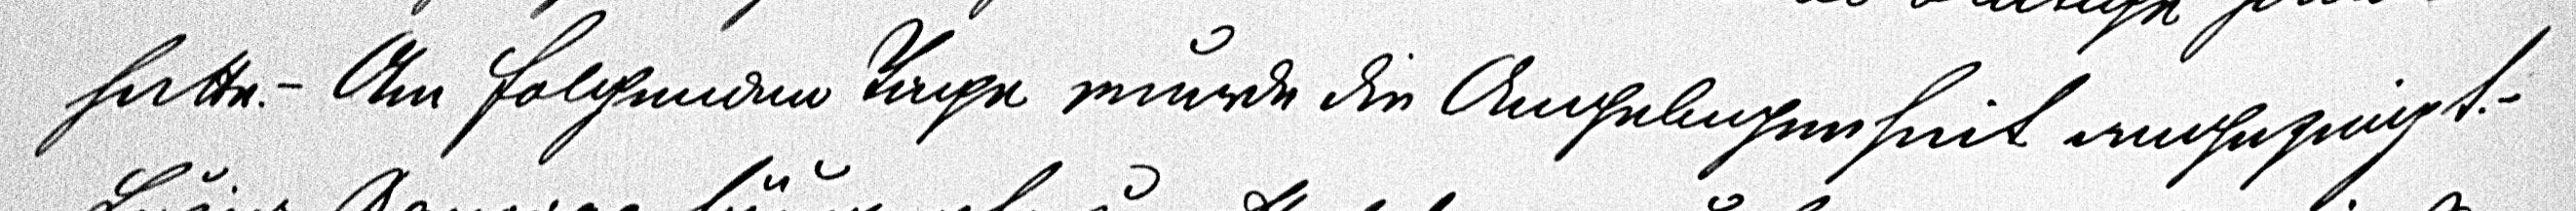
hatte.- Am folgenden Tage wurde die Angelegenheit angezeigt.-
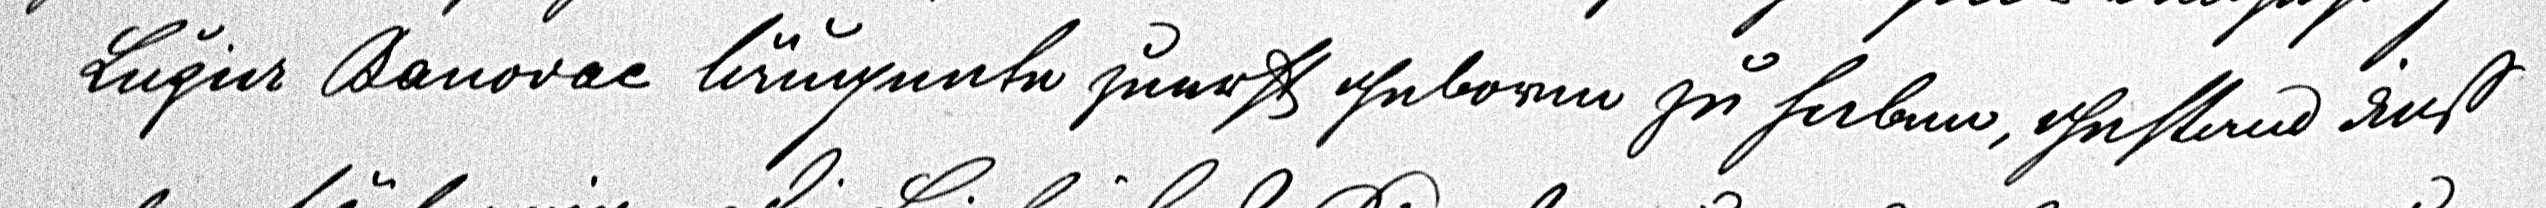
Luzia Banovac läugnete zuerst geboren zu haben, gestand dieß
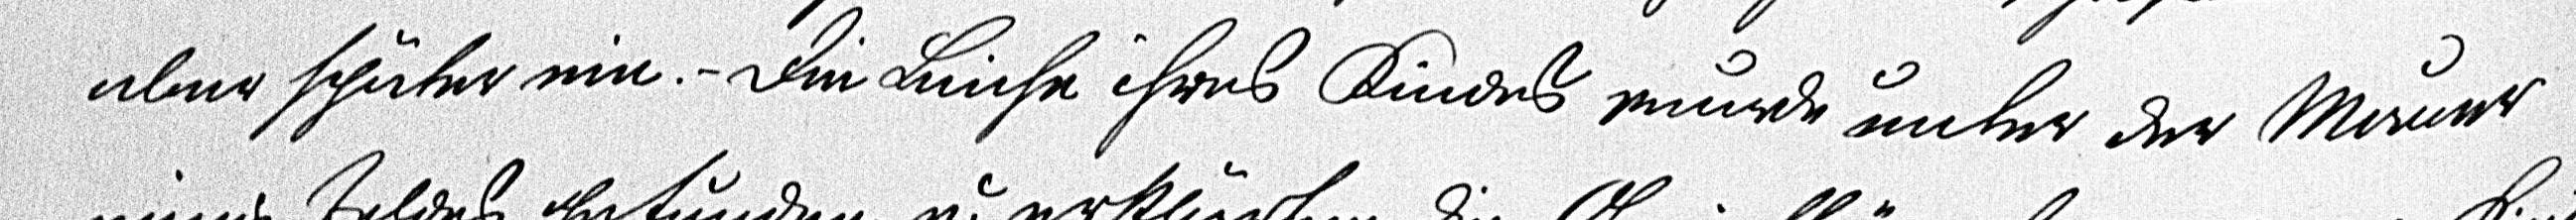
aber später ein.- Die Leiche ihres Kindes wurde unter der Mauer
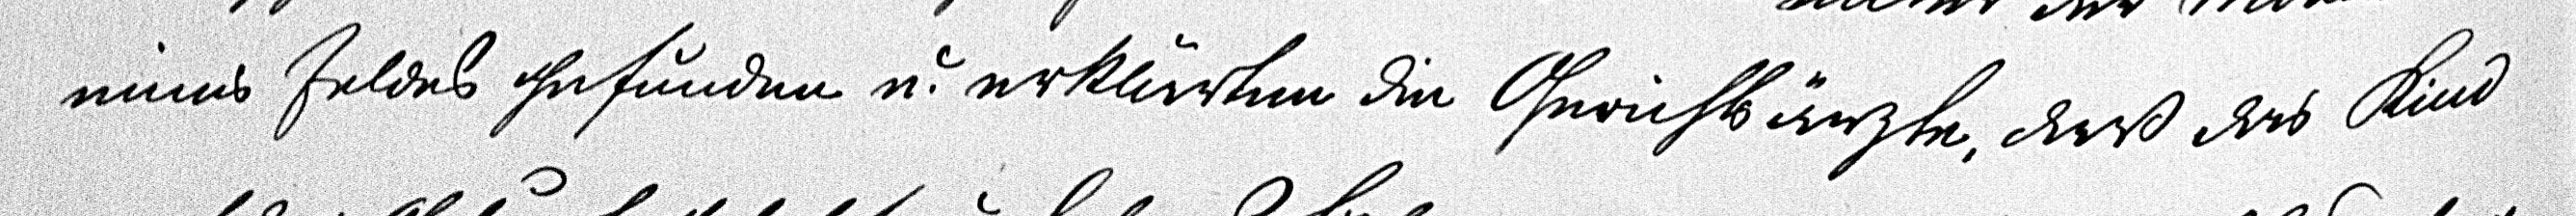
eines xxeldes gefunden u. erklärten die Gerichtsärzte, daß das Kind
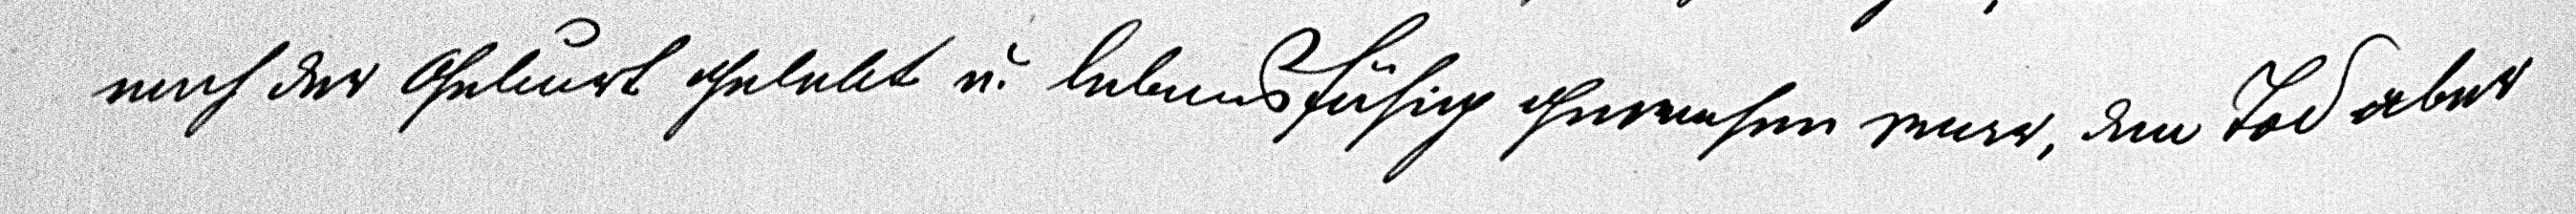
nach der Geburt gelebt u. lebensfähig gewesen war, den Tod aber
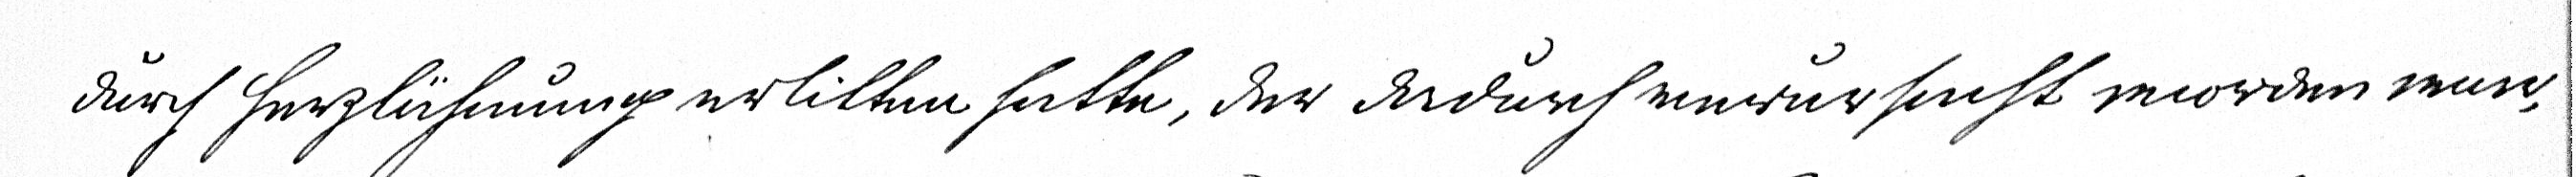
durch Herzlähmung erlitten hatte, der dadurch verursacht worden war,
